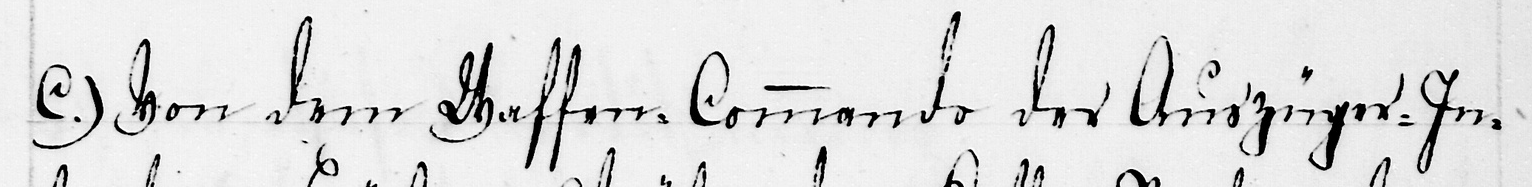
C.) Von dem Waffen-Commando der Auszüger-In¬
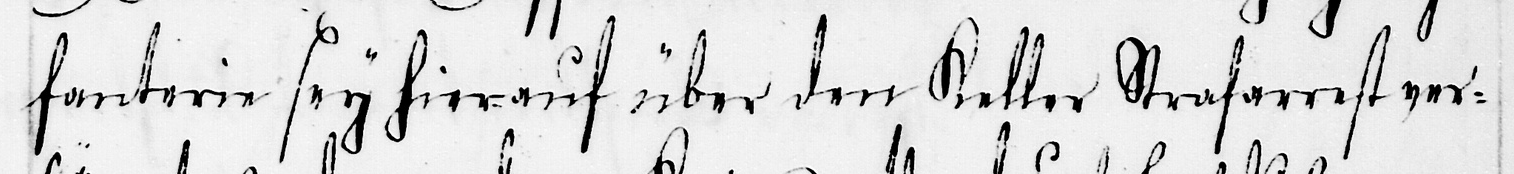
fanterie sey hierauf über den Keller Strafarrest ver¬
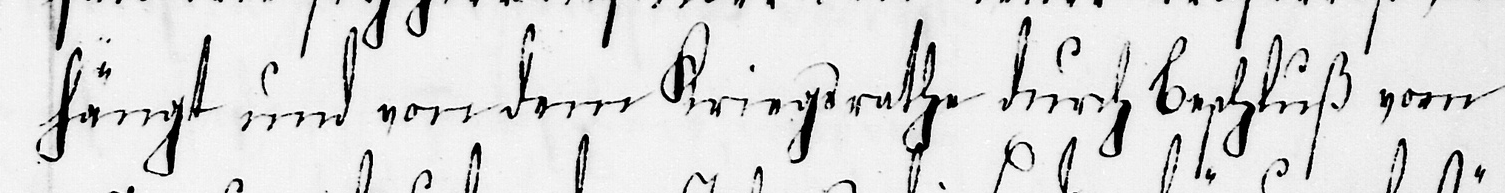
hängt und von dem Kriegsrathe durch Beschluß vom
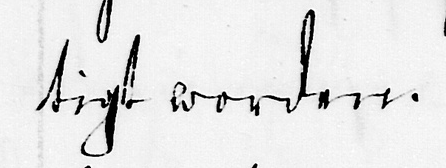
tigt worden.
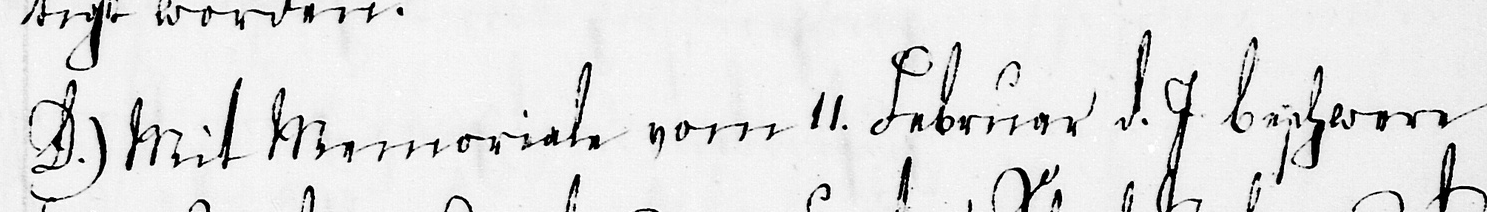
D.) Mit Memoriale vom 11. Februar d. J. beschwere
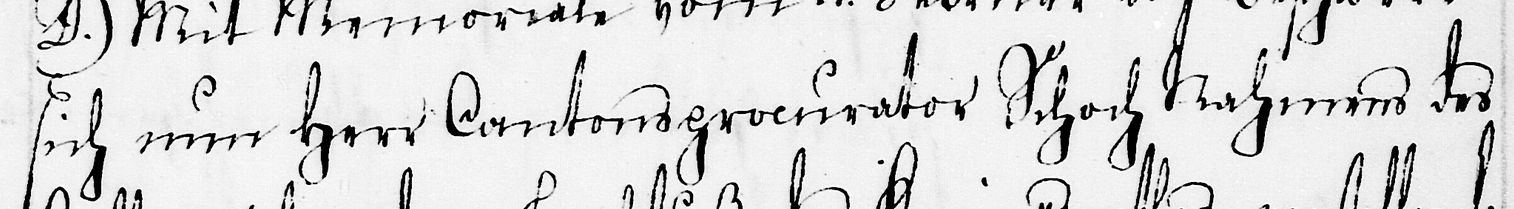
sich nun Herr Cantonsprocurator Schoch Nahmens des
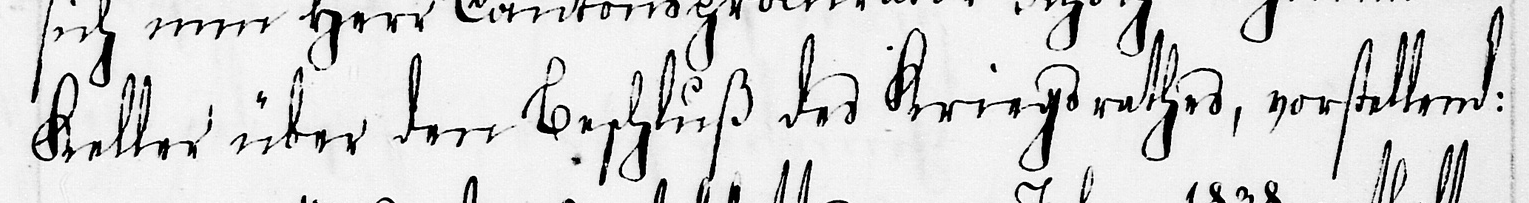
Keller über den Beschluß des Kriegsrathes, vorstellend:
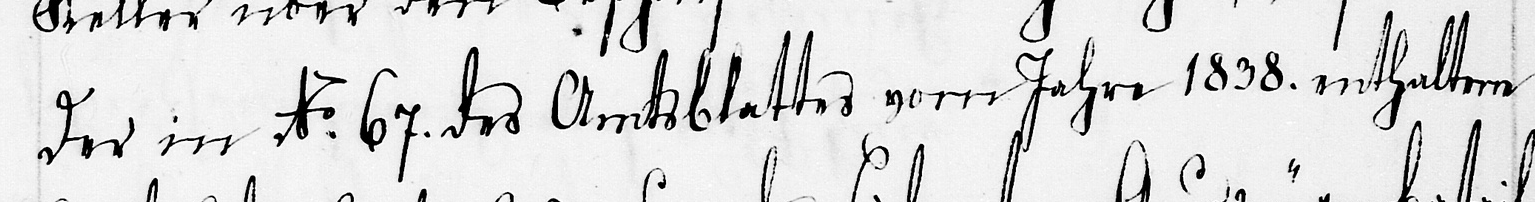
Der in No. 67. des Amtsblattes vom Jahre 1838. enthaltene
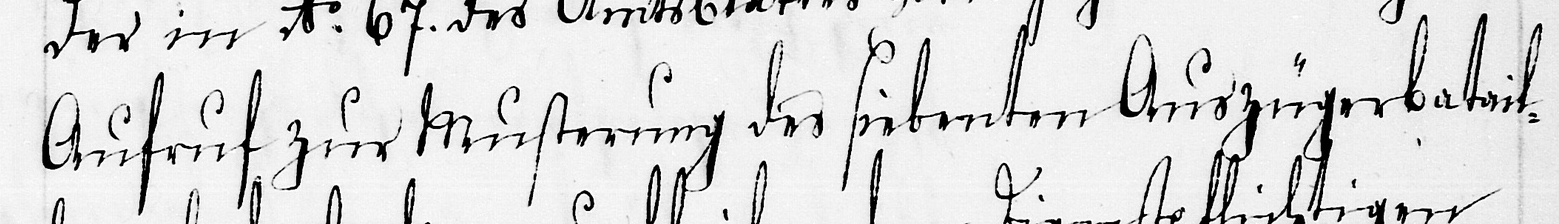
Aufruf zur Musterung des siebenten Auszügerbatail¬
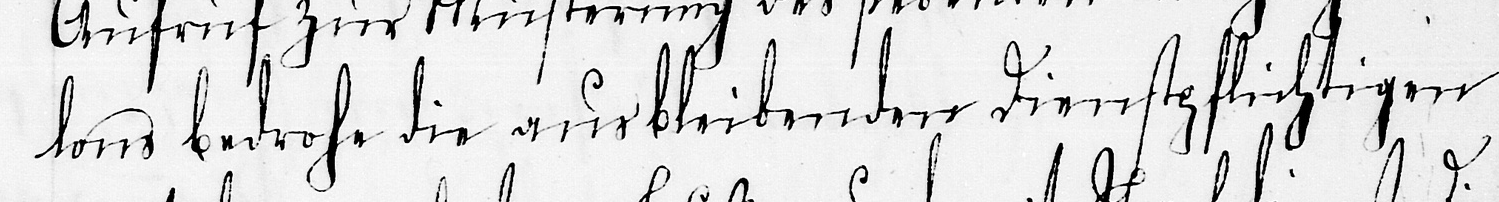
lons bedrohe die ausbleibenden Dienstpflichtigen
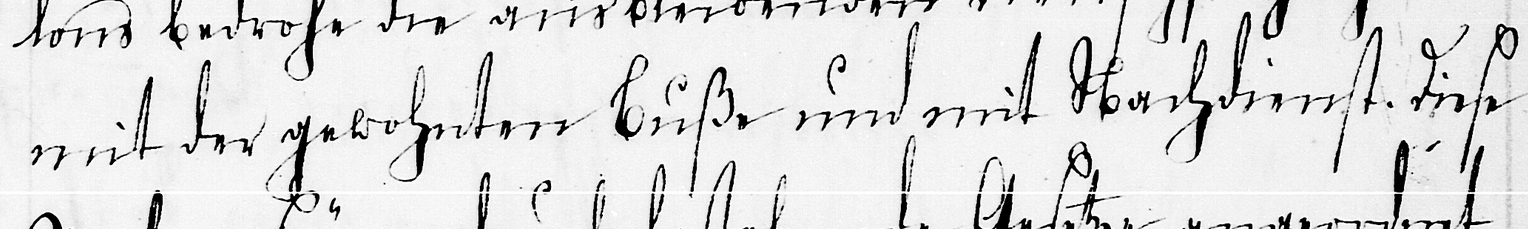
mit der gewohnten Buße und mit Nachdienst. Diese
